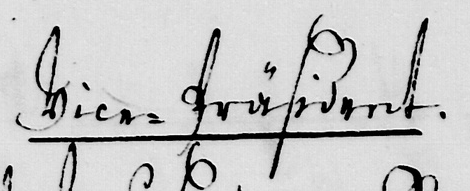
Vice-Präsident.
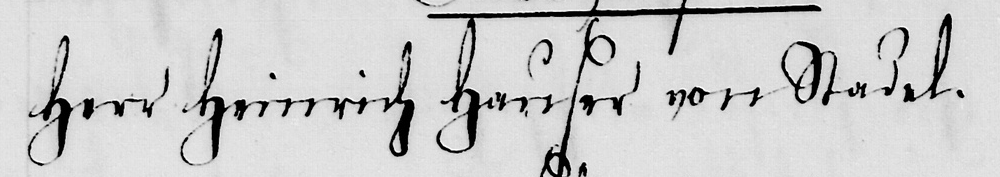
Herr Heinrich Hauser von Stadel.
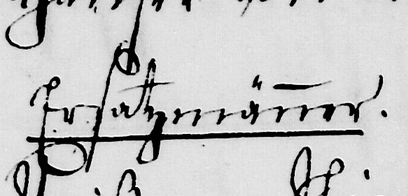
Ersatzmänner.
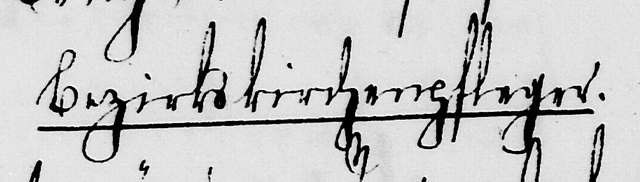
Bezirksschulpfleger.
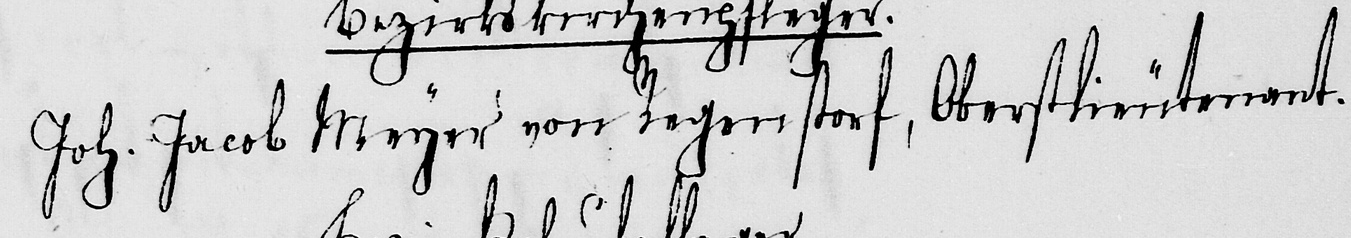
Joh. Jacob Meyer von Regenstorf, Oberstlieutenant.
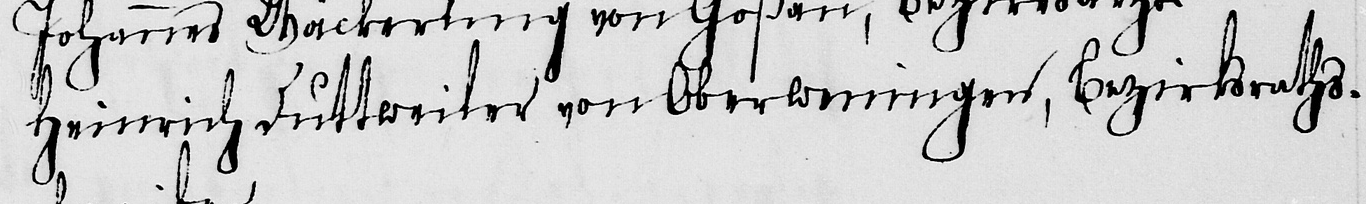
Heinrich Duttweiler von Oberweningen, Bezirksraths¬
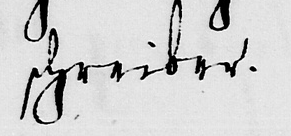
schreiber.
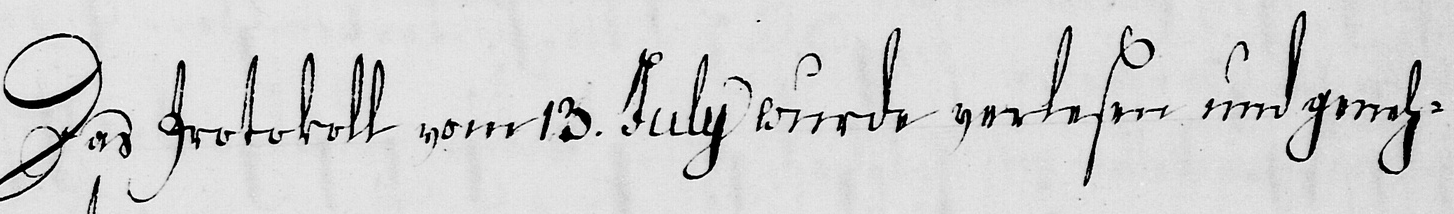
Das Protokoll vom 13. July wurde verlesen und geneh¬
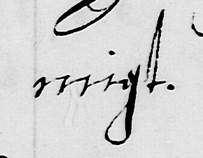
migt.
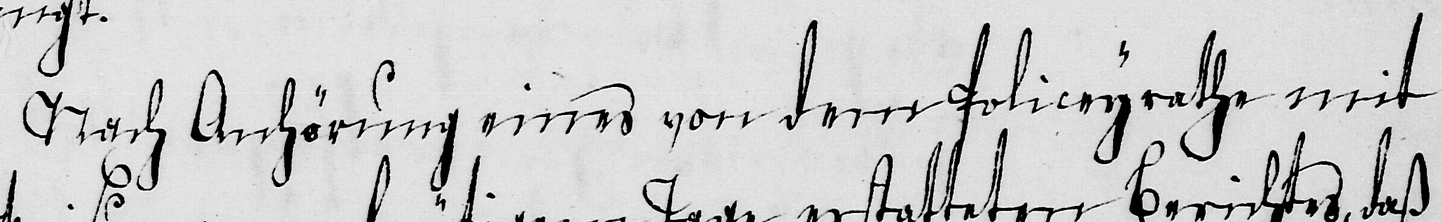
Nach Anhörung eines von dem Policeyrathe mit
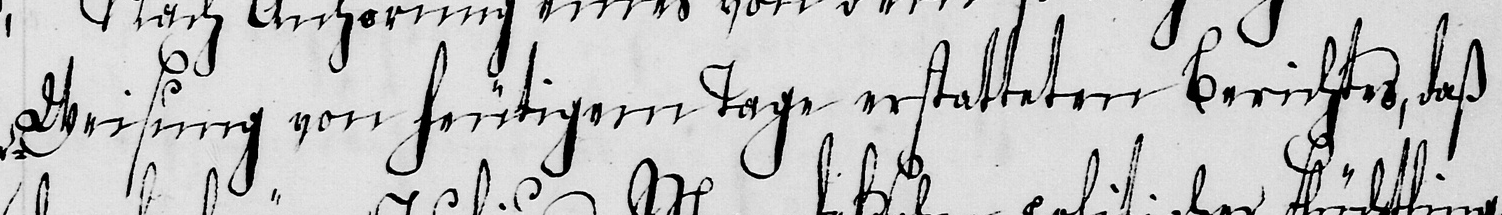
Weisung von heutigem Tage erstatteten Berichtes, daß
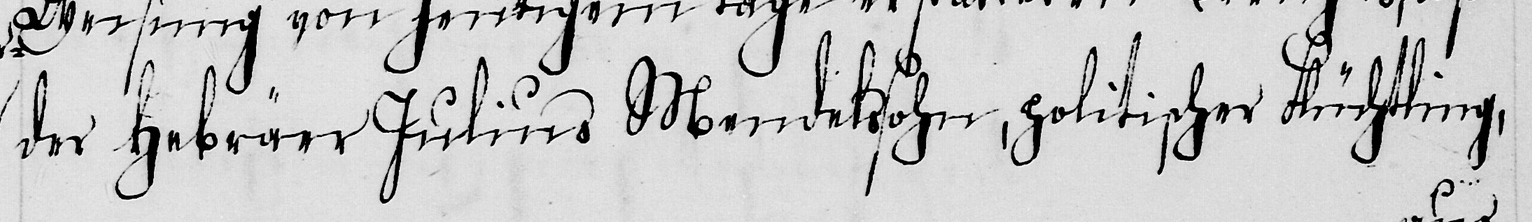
der Hebräer Julius Mendelssohn, politischer Flüchtling,
